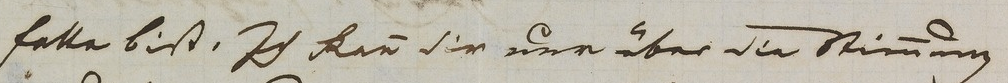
Falle bist. Ich kann dir nur über die Stimmung
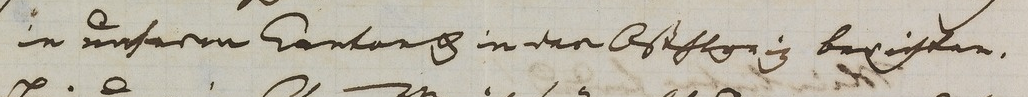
in unserm Canton & in der Ostschweiz berichten.
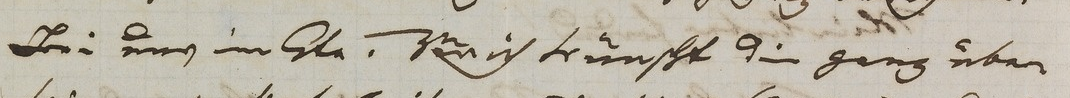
Bei uns im Ctn. Zürich wünscht die ganz über-
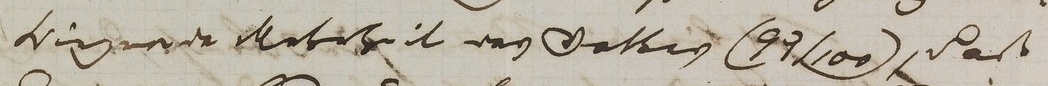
wiegende Mehrheit des Volkes (99/100), daß
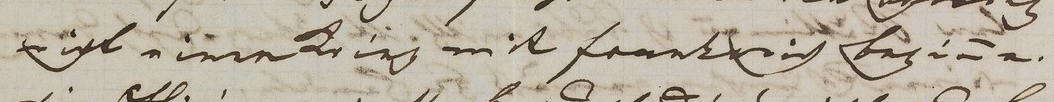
nicht einen Krieg mit Frankreich beginne.
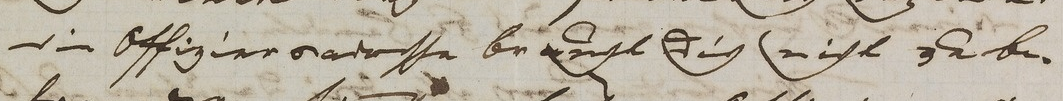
Die Offiziersadresse braucht dich nicht zu be-
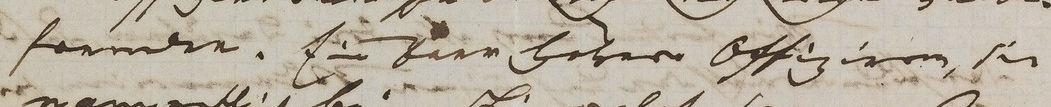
fremden. Ein Paar höhere Offiziere, die
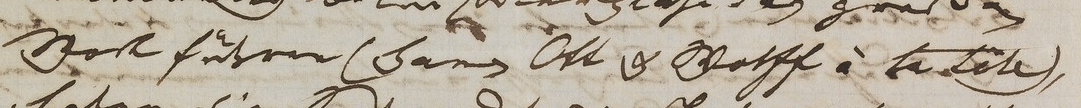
Wort führen ( Hans Ott & Wolff à la tête),
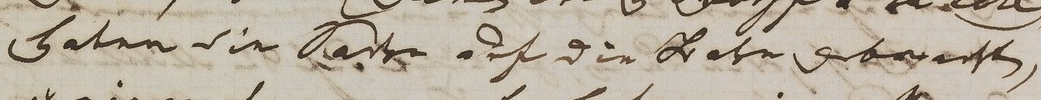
haben die Sache auf die Bahn gebracht,
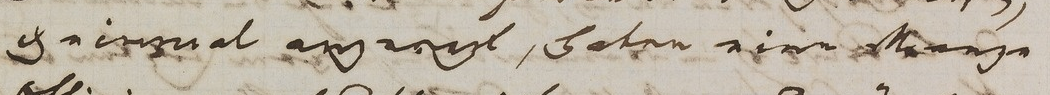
& einmal angeregt, haben eine Menge
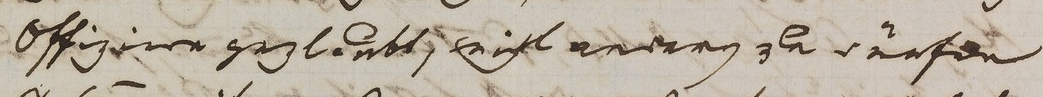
Offiziere geglaubt, nicht anders zu dürfen
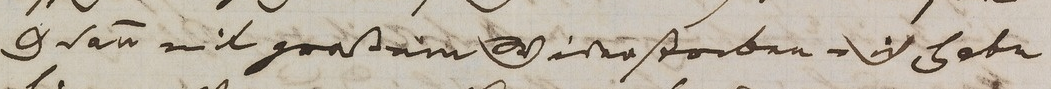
& dann mit großem Widerstreben – ich habe
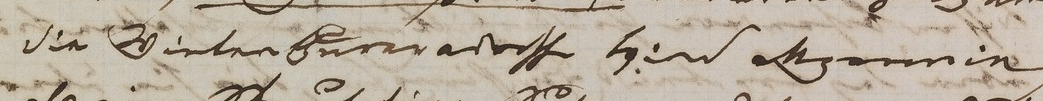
Die Winterthureradresse wird allgemein
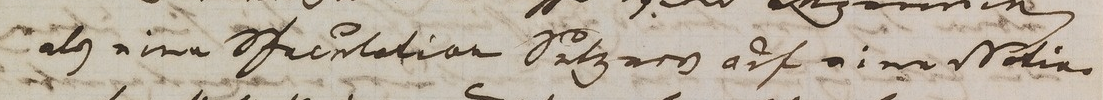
als eine Speculation Sulzers auf eine Natio-
